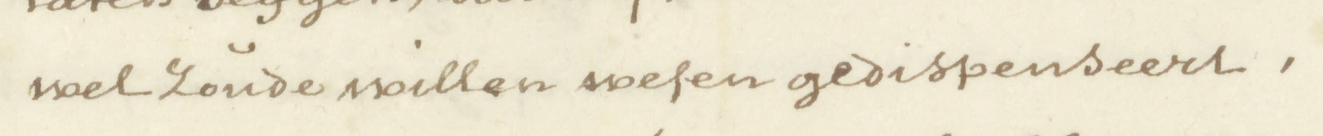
wel zoude willen wesen gedispenseert,
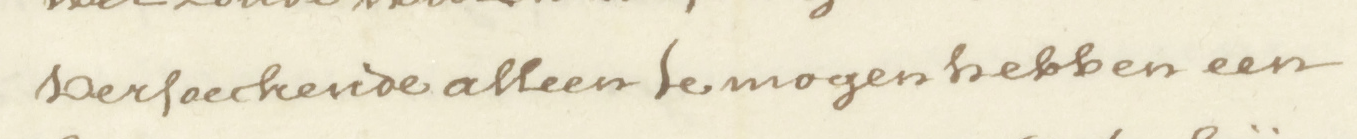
versoeckende alleen te mogen hebben een
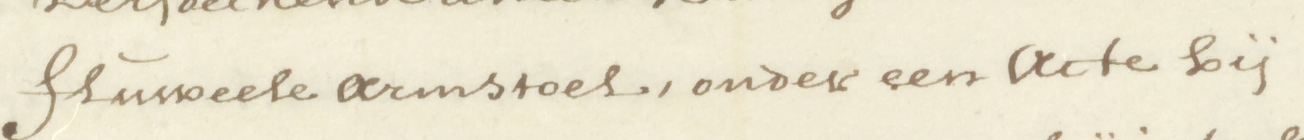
fluweele armstoel, onder een Acte bij
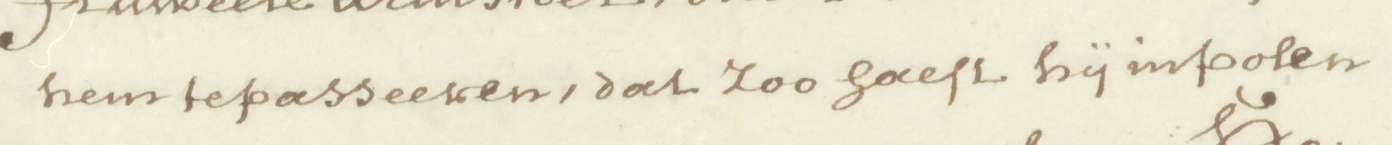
hem te passeeren, dat zoo haest hij in Polen
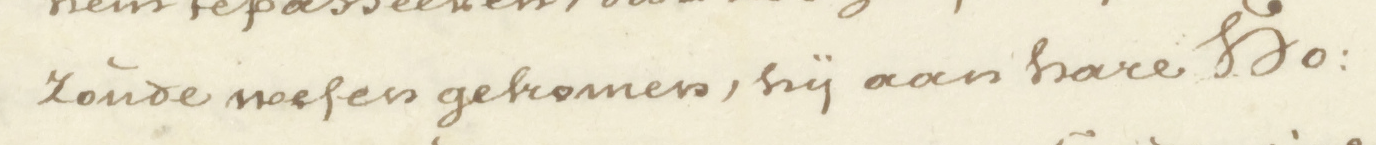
zoude wesen gekomen, hij aan hare Ho:
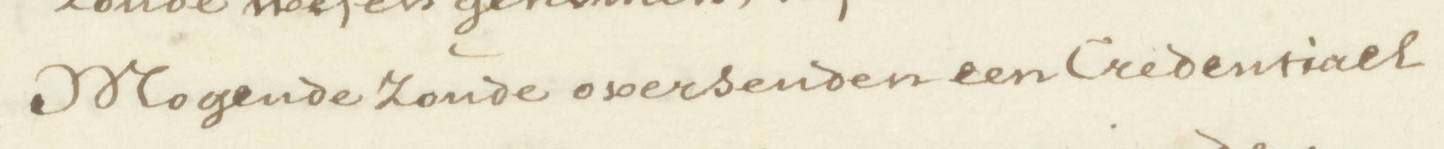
Mogende zoude oversenden een Credentiael
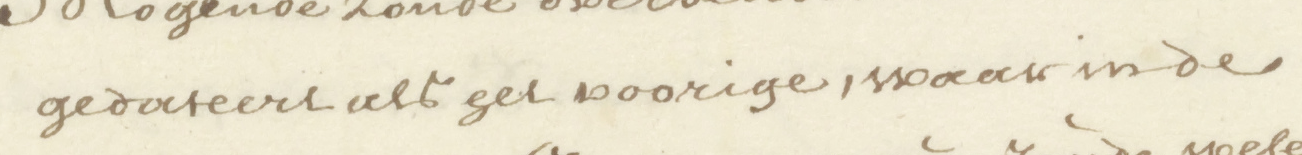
gedateert als het voorige, waar in de
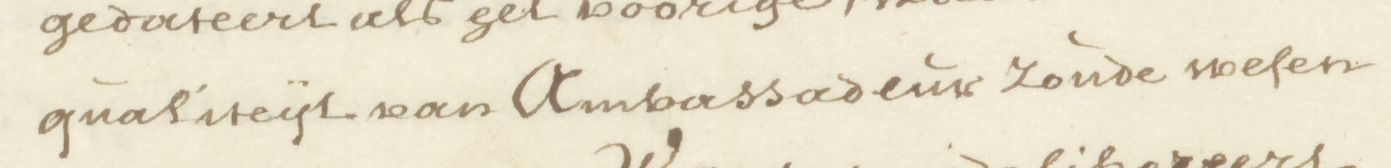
qualiteijt van Ambassadeur zoude wesen
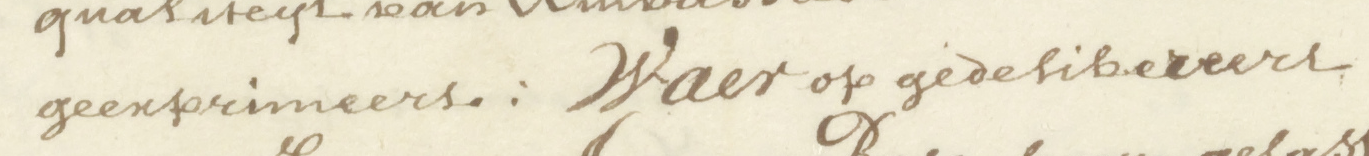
geexprimeert: Waer op gedelibereert
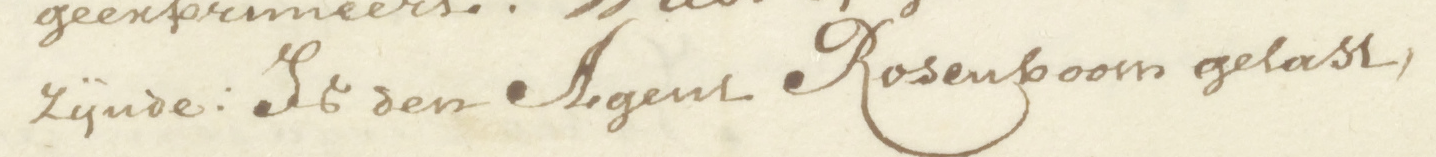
zijnde: Is van Agent Rosenboom gelast
